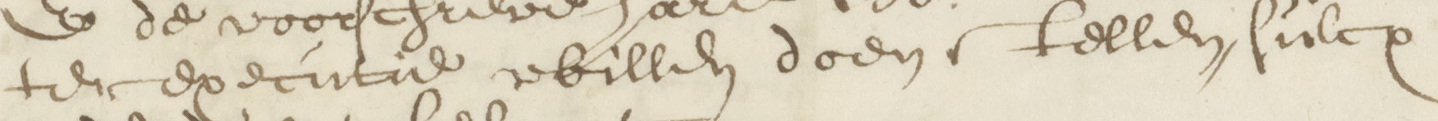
ter executie willen doen stellen, sulcx
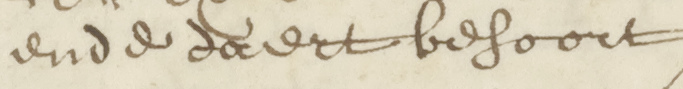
ende daert behoort.
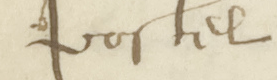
postel
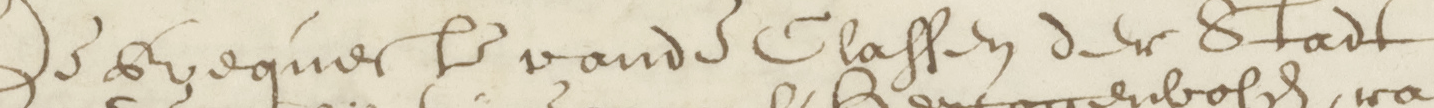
De Requeste vande Classen der Stadt
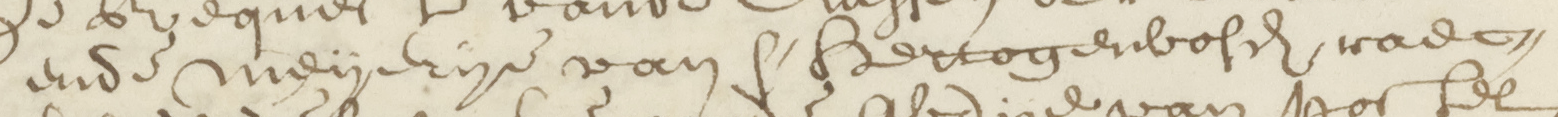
ende Meijerije van s'Hertogenbosch raec„
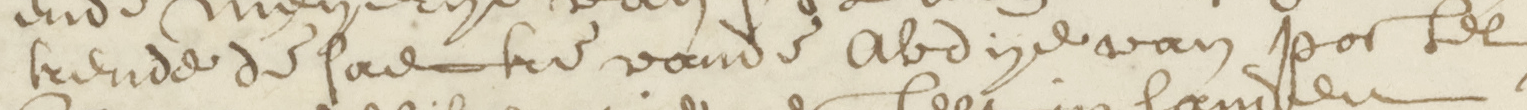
kende de saecke vande Abdije van Postel,
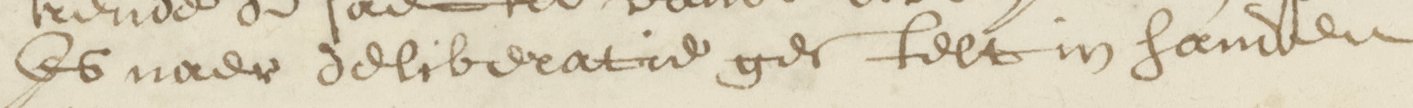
Is naer deliberatie gestelt in handen
